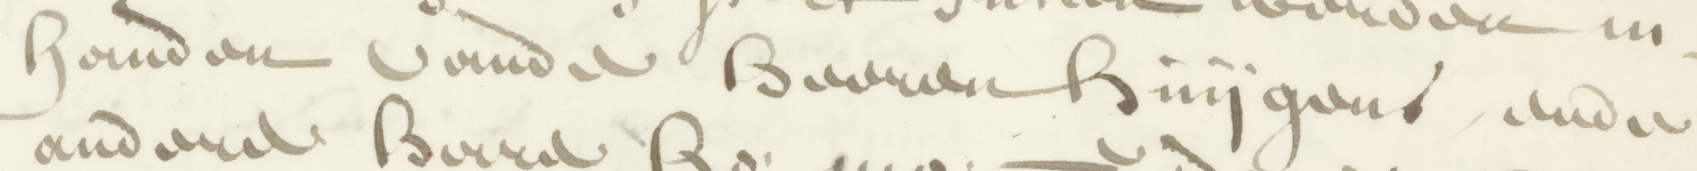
handen vande Heeren Huijgens, ende
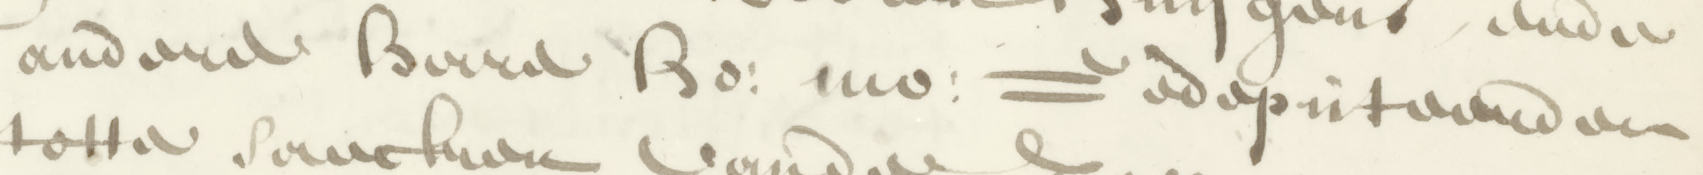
andere hare Ho:Mo: Gedeputeerden
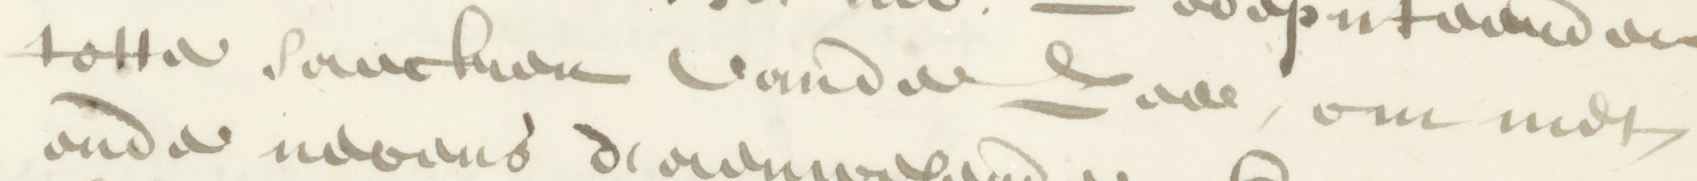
totte saecken vande Zee, om met
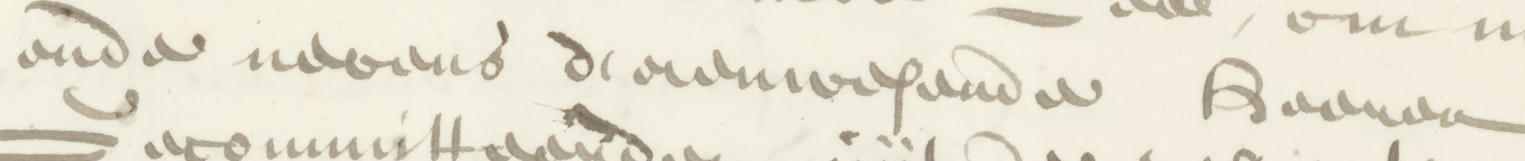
ende nevens d‛aenwesende Heeren
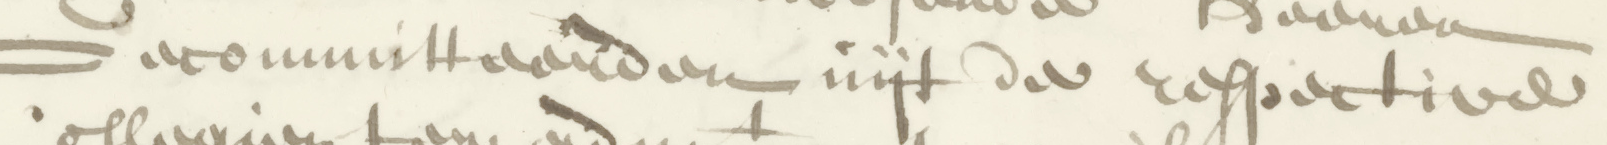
Gecommitteerden uijt de respective
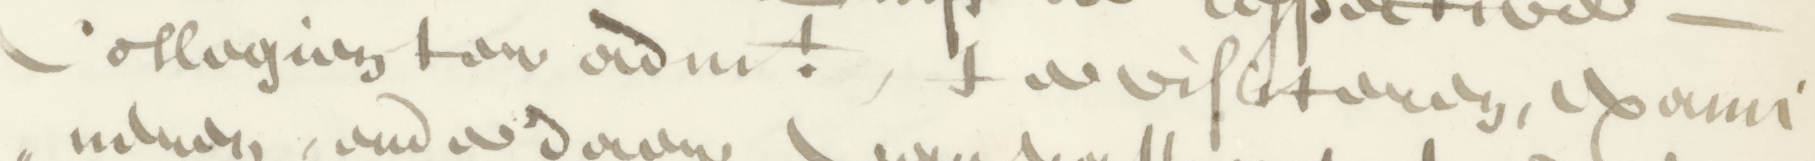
Collegien ter admt., te visiteren, exami
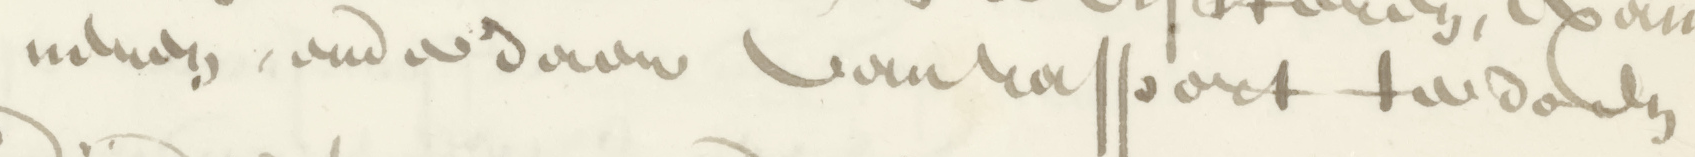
„neren, ende daer van rapport te doen,
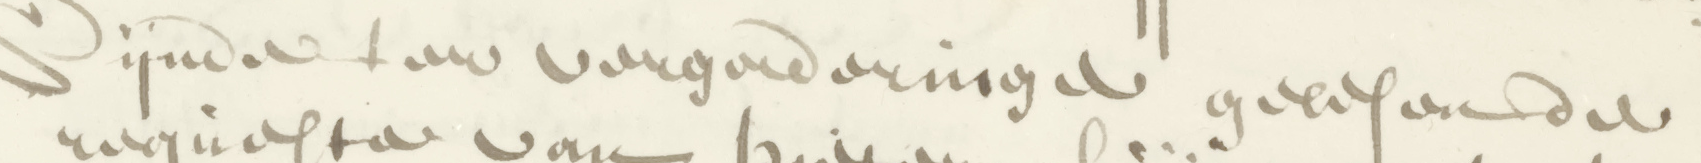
Sijnde ter vergaderinge gelesen de
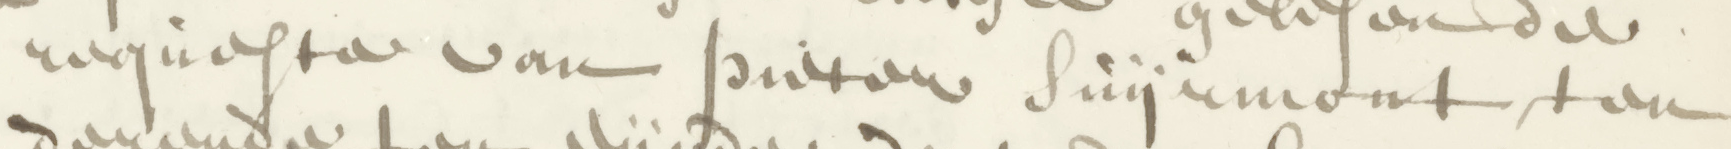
requeste van Pieter Suijrmont, ten
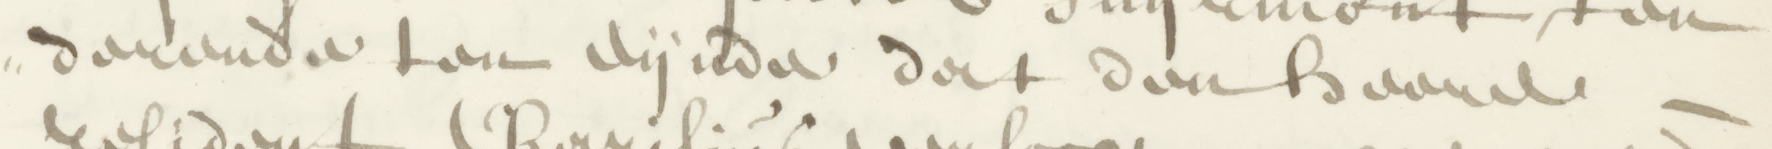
„derende ten eijnde dat den heere —
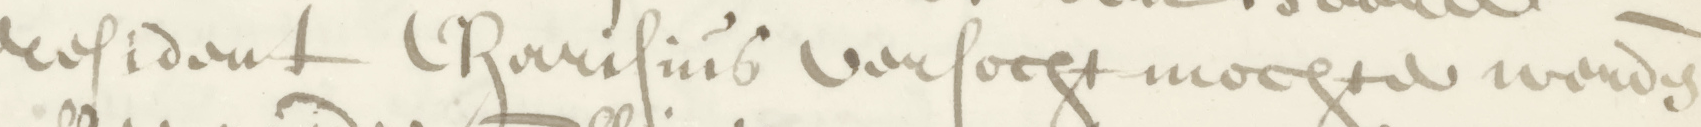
resident Charisius versocht mochte werden
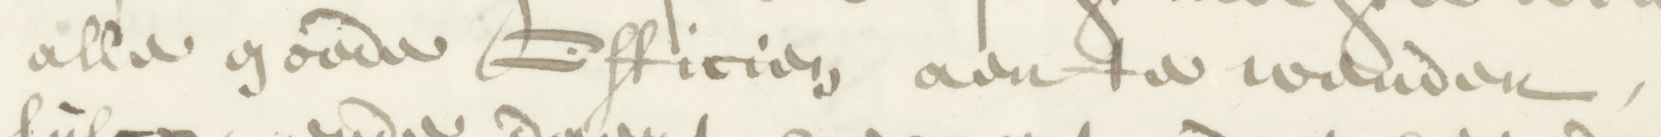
alle goede Officien aen te wenden,
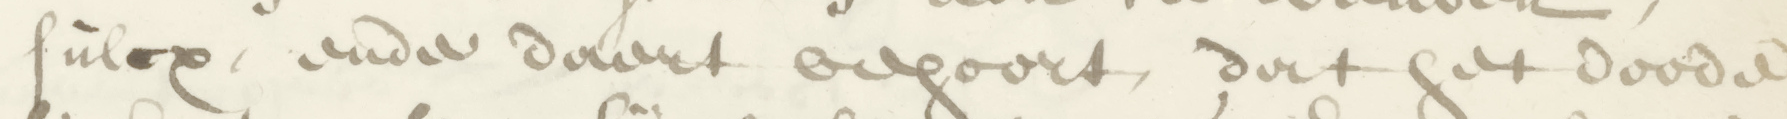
sulcx, ende daert behoort, dat het doode
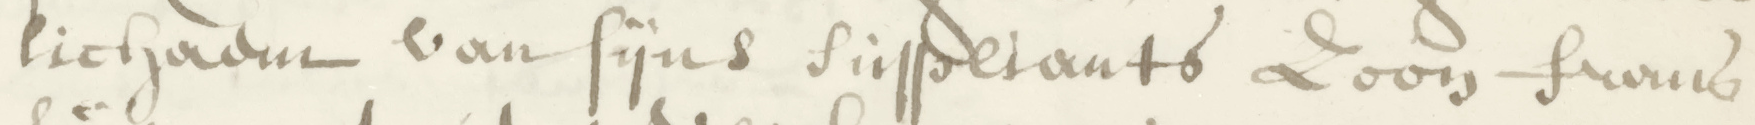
lichaem van sijns Suppliants Zoon frans
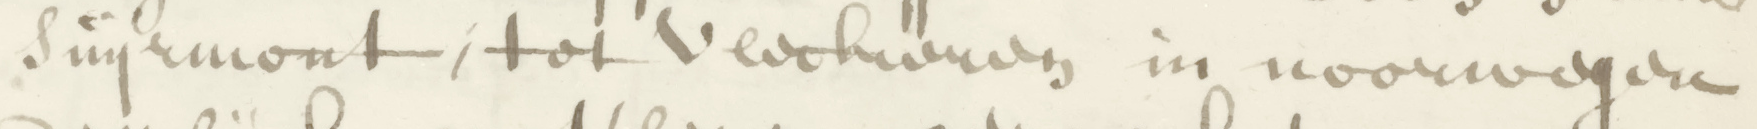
Suijrmont, tot Vleckeren in noorwegen
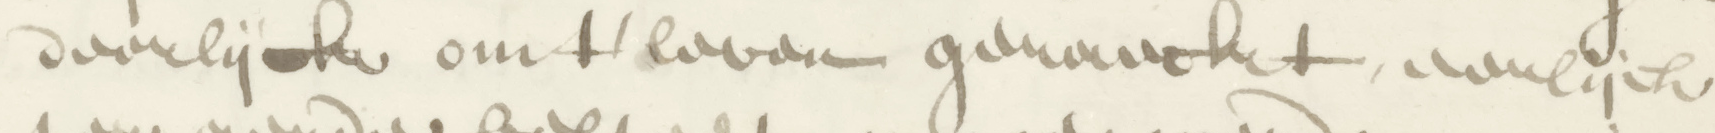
deerlijck om t' leven geraeckt, eerlijck
